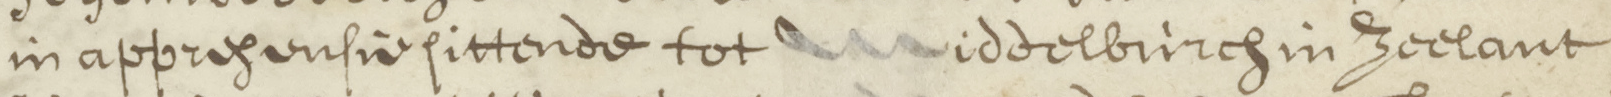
in apprehensie sittende tot Middelburch in Zeelant;
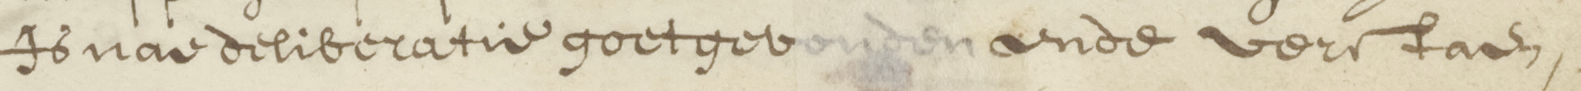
Is nae deliberatie goetgevonden ende verstaen,
